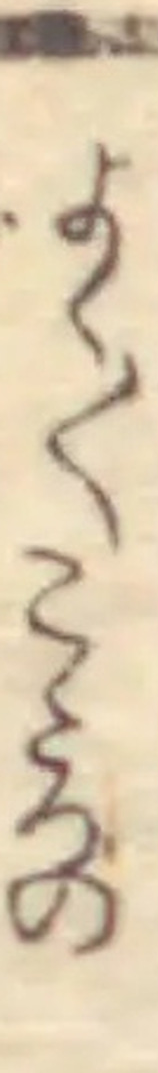よく〳〵こゝろの
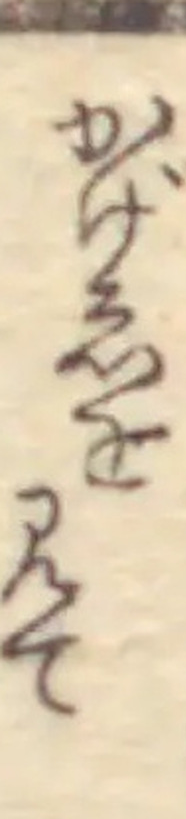かげゑを見て
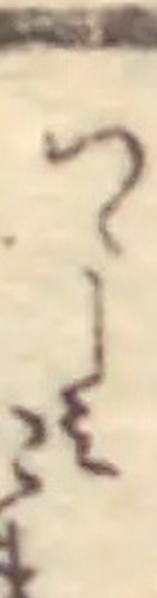つゝしみ
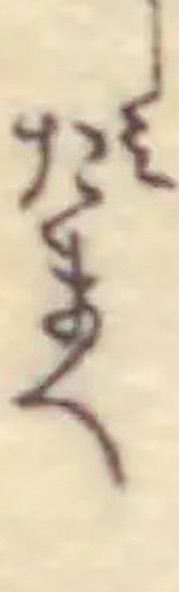たまへ
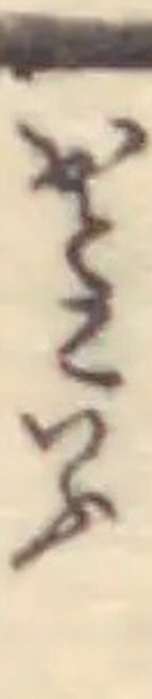おとこいふ
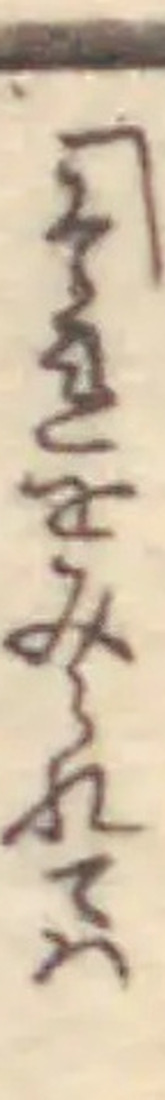乁それをみられては
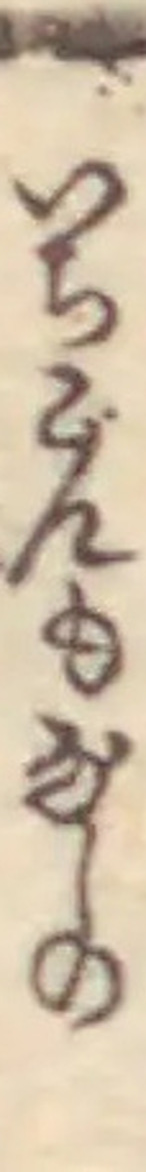いちごんもなしの
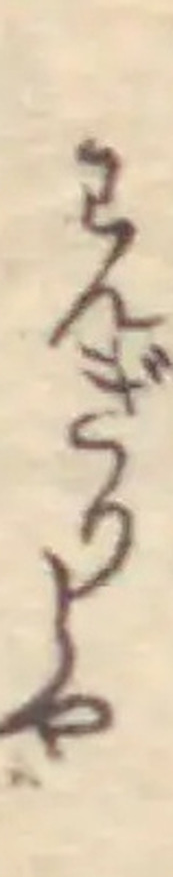わんぎりしや

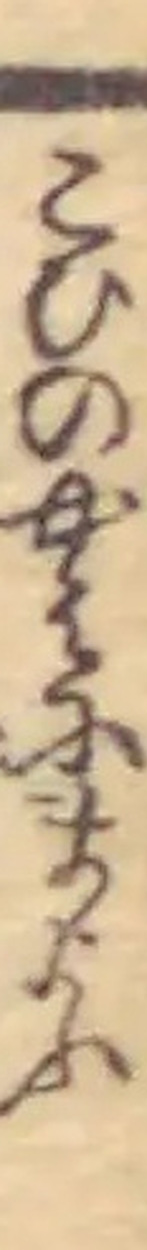こひのやみにまよふ
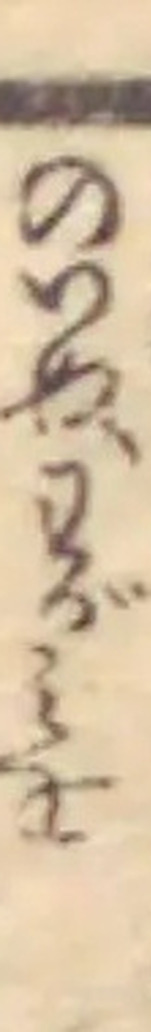のいぬわがみを
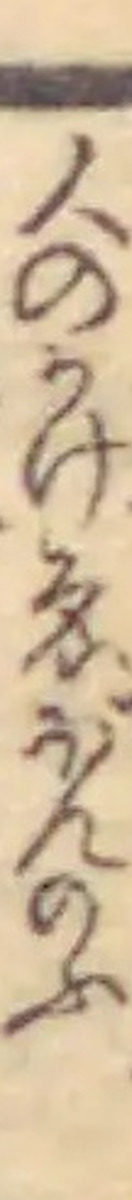人のかけゑぼんのふ
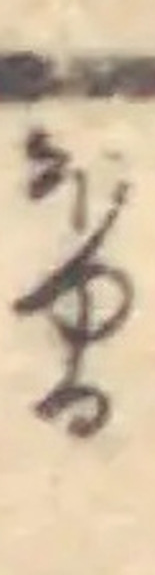ほゆる
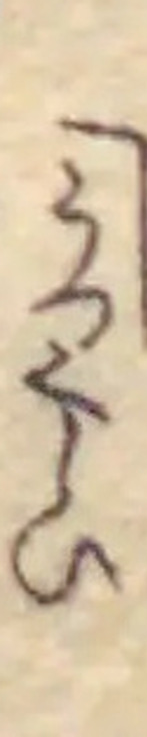乁うつくしい
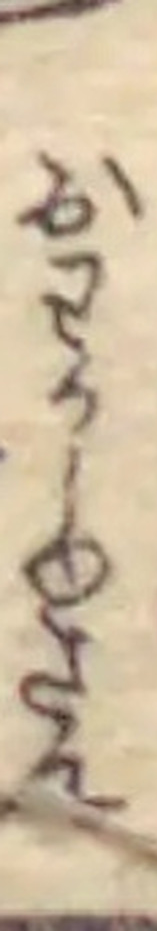おわかしゆさん
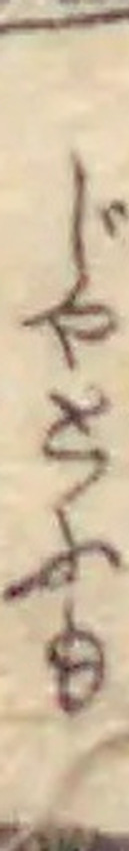じやどふも
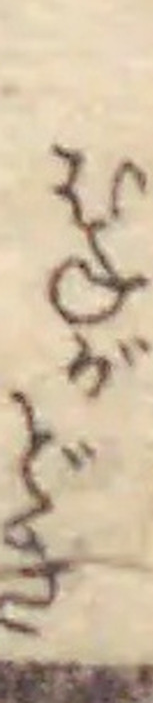むねがどき
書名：児訓影絵喩 3巻
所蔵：国立国会図書館 National Diet Library, JAPAN
